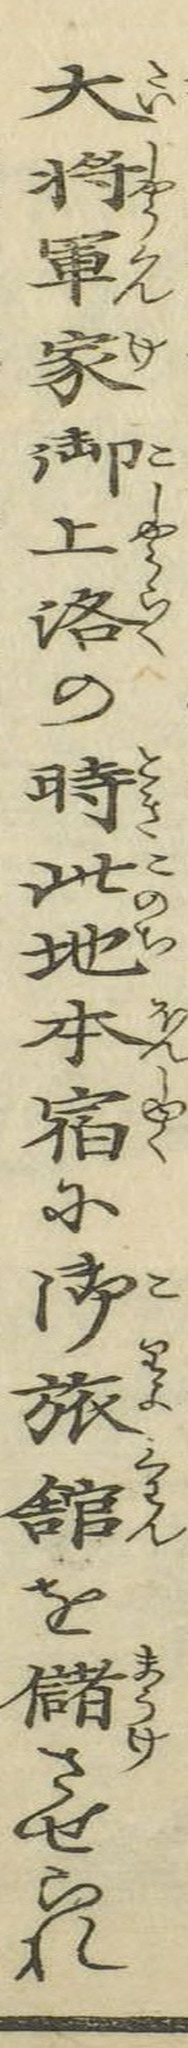大将軍家御上洛の時此地本宿に御旅館を儲させられ
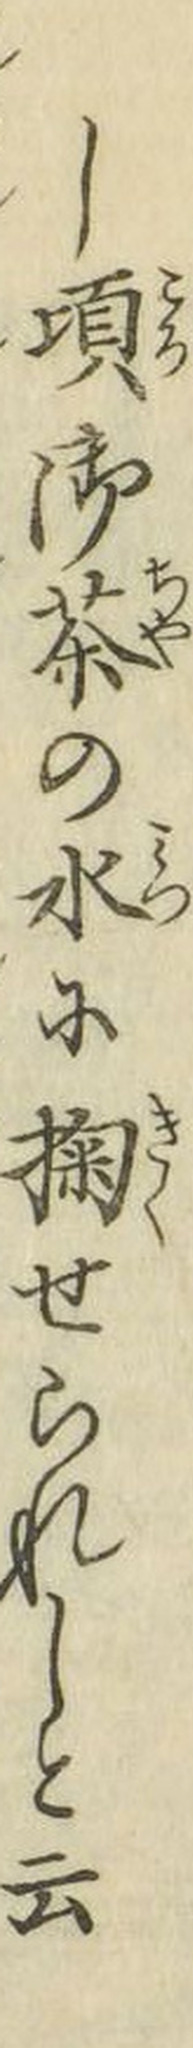し頃御茶の水に掬せられしと云
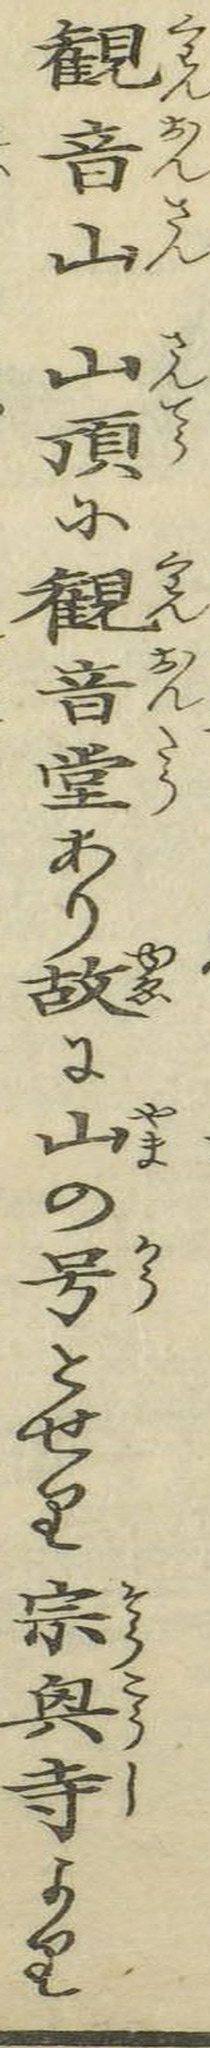観音山山頂に観音堂あり故に山の号とせり宗興寺より
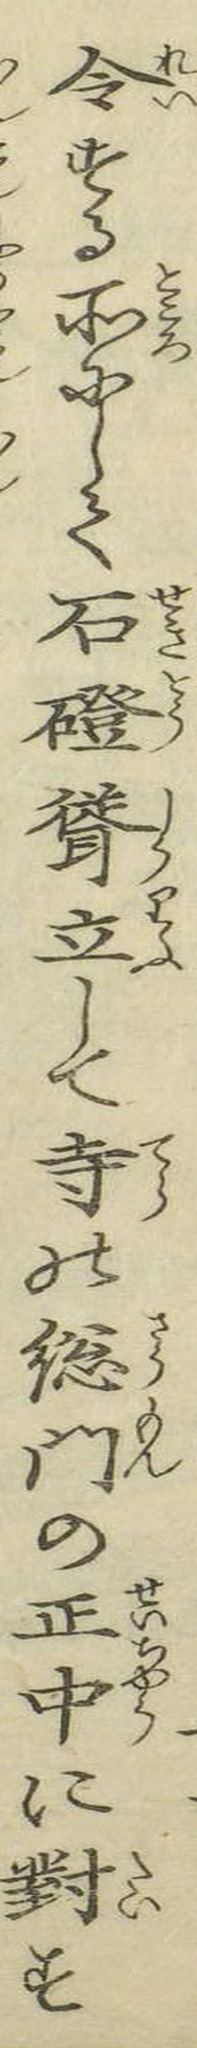令する所にして石磴聳立して寺の総門の正中に對す
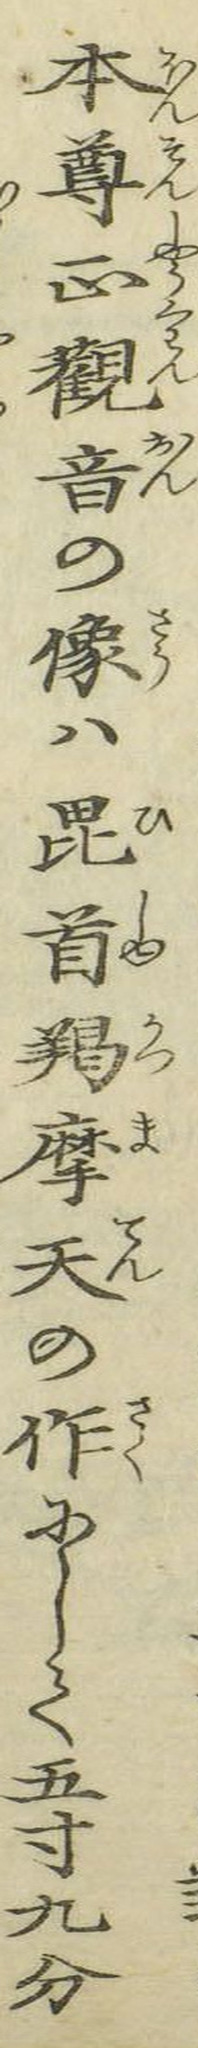本尊正観音の像は毘首羯摩天の作にして五寸九分
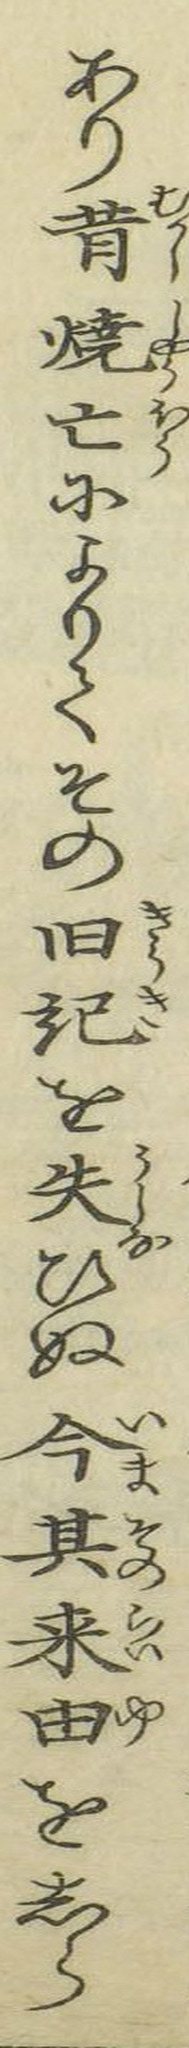あり昔焼亡によりてその旧記を失ひぬ今其来由をしら
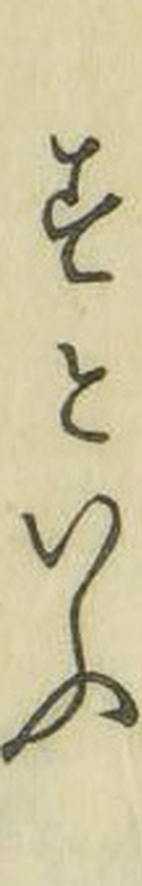すといふ

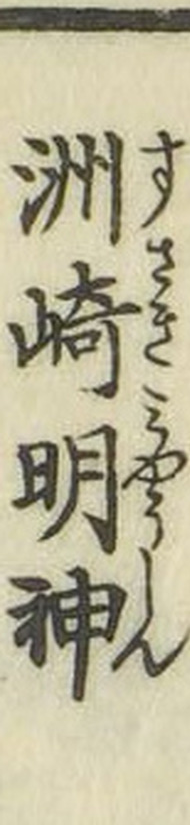洲崎明神

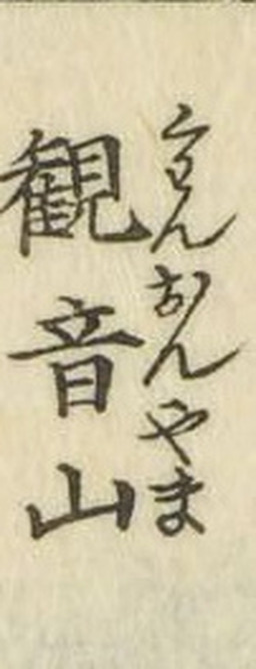観音山
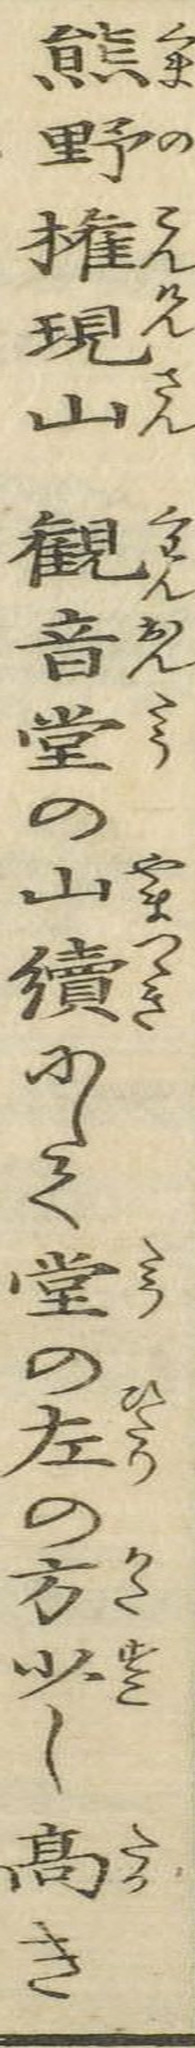熊野権現山観音堂の山續にして堂の左の方少し高き
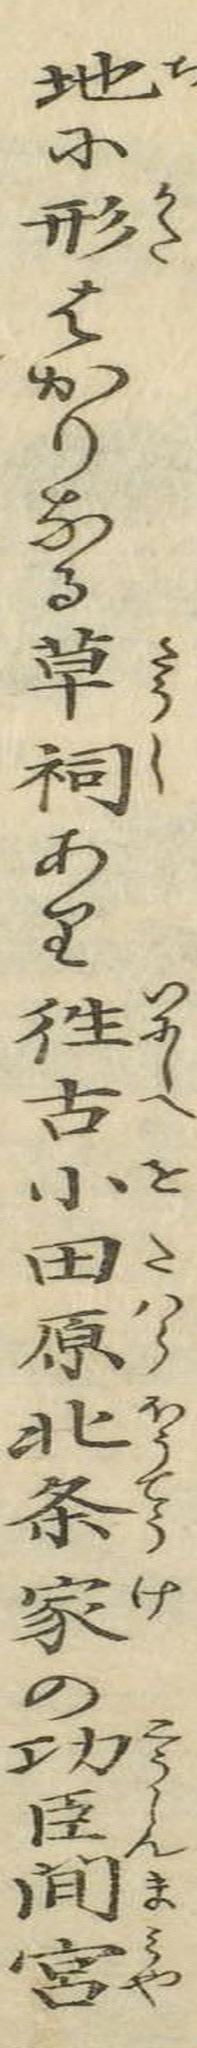地に形はかりなる草祠あり往古小田原北条家の功臣間宮
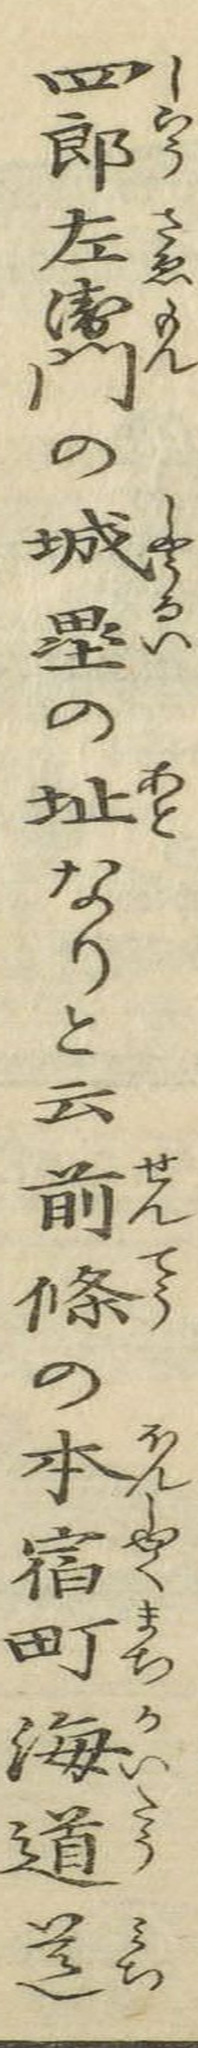四郎左衛門の城塁の址なりと云前條の本宿町海道道
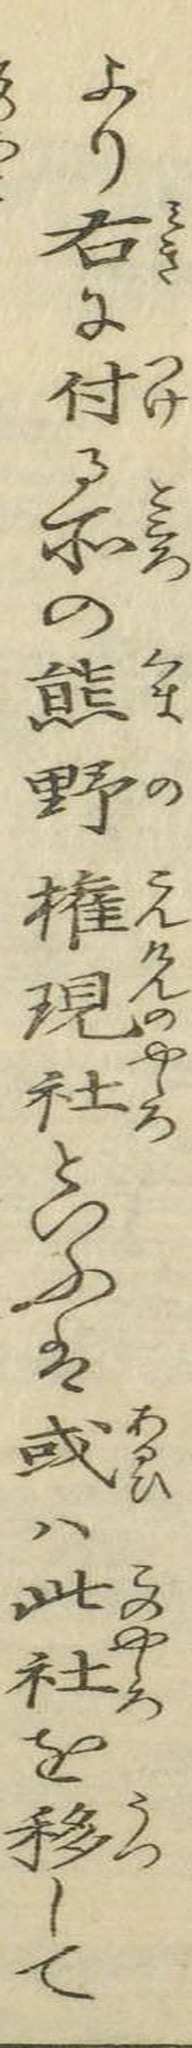より右に付る所の熊野権現社といふは或は此社を移して
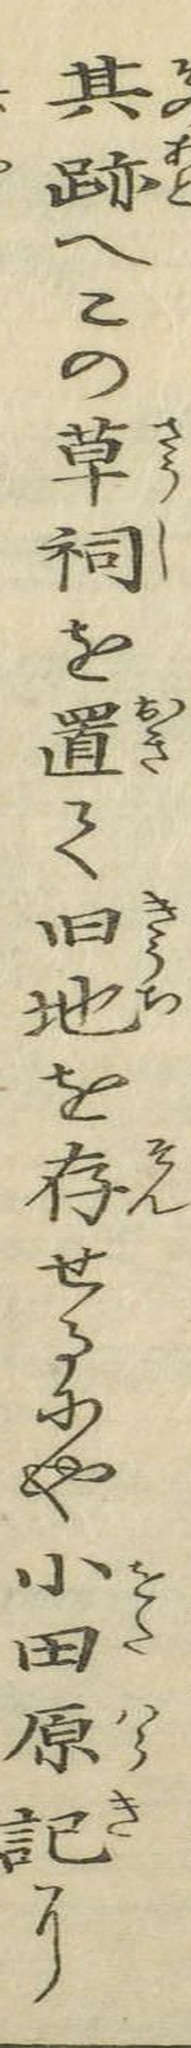其跡へこの草祠を置て旧地を存せるにや小田原記に
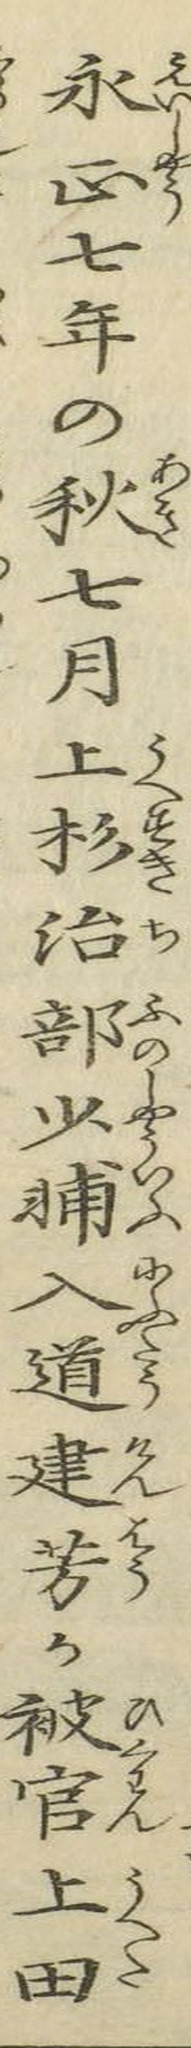永正七年の秋七月上杉治部少輔入道建芳か被官上田
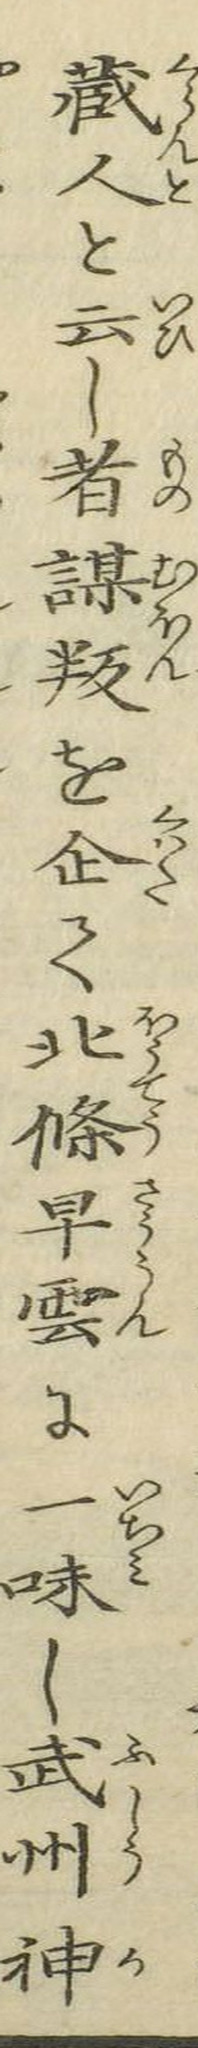蔵人と云し者謀叛を企て北條早雲に一味し武州神
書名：江戸名所図会 20巻 巻之5
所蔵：東京学芸大学教育コンテンツアーカイブ
